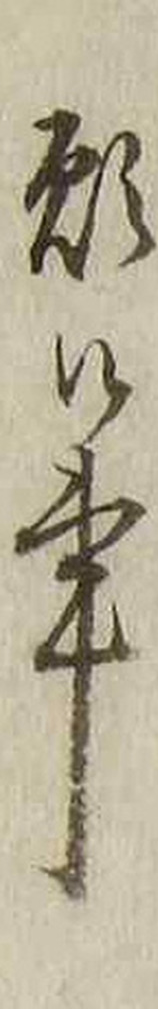願候事
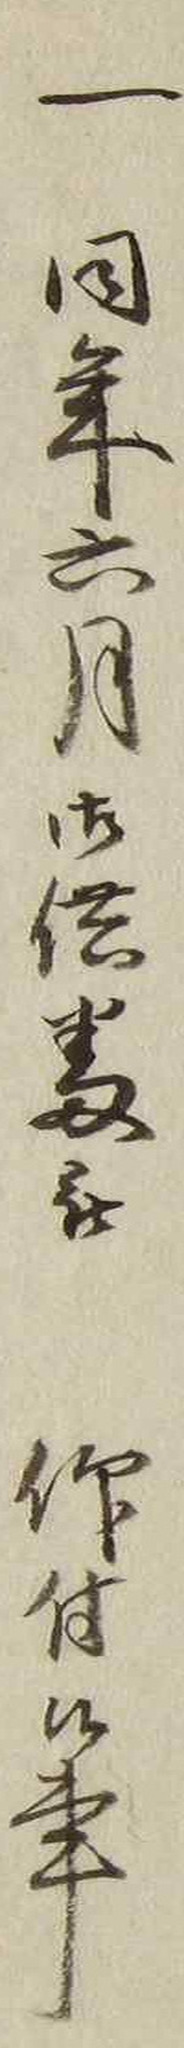一同年六月御供番被仰付候事
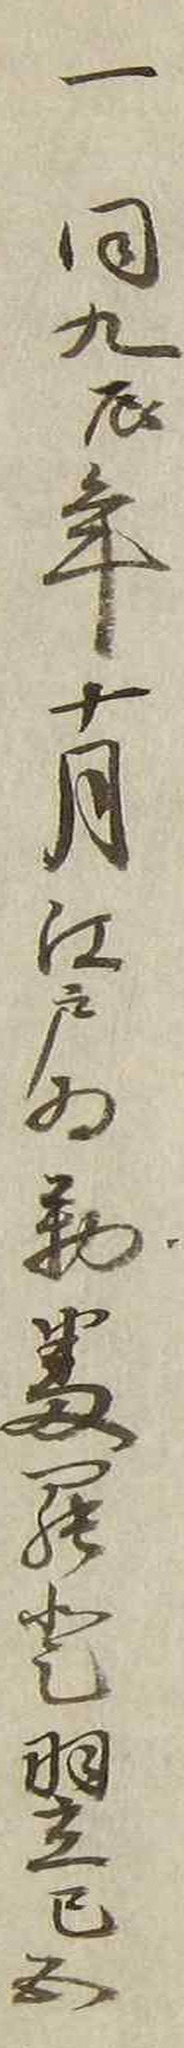一同九辰年十月江戸為勤番罷登翌巳五
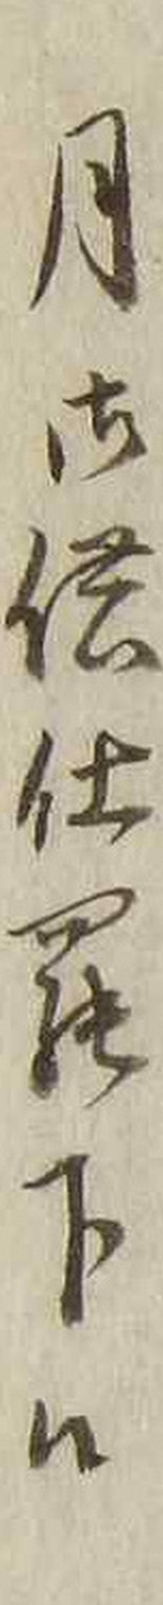月御供仕罷下候

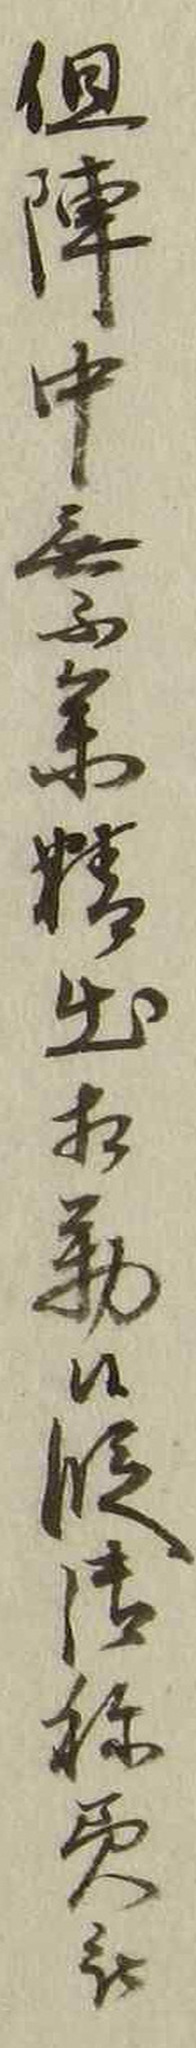但陣中無不参精出相勤候段御称美被
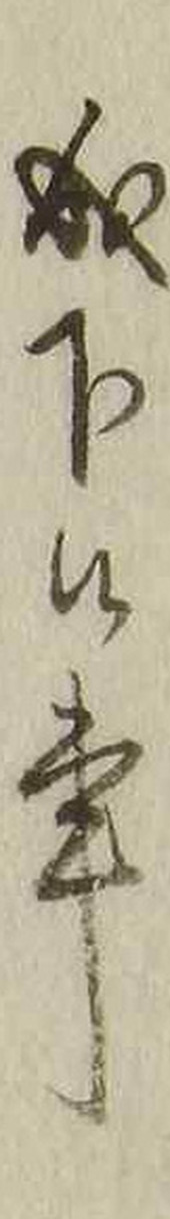成下候事
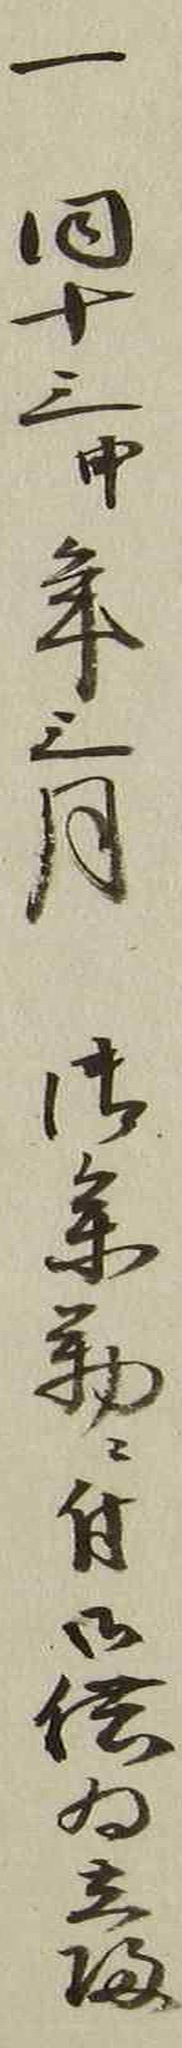一同十三申年三月御参勤ニ付御供為立帰
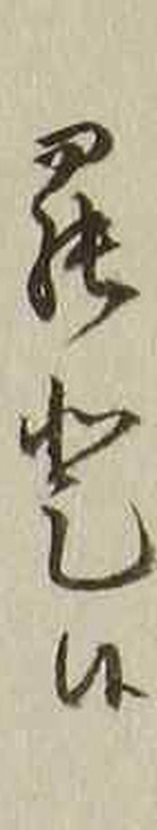罷登候
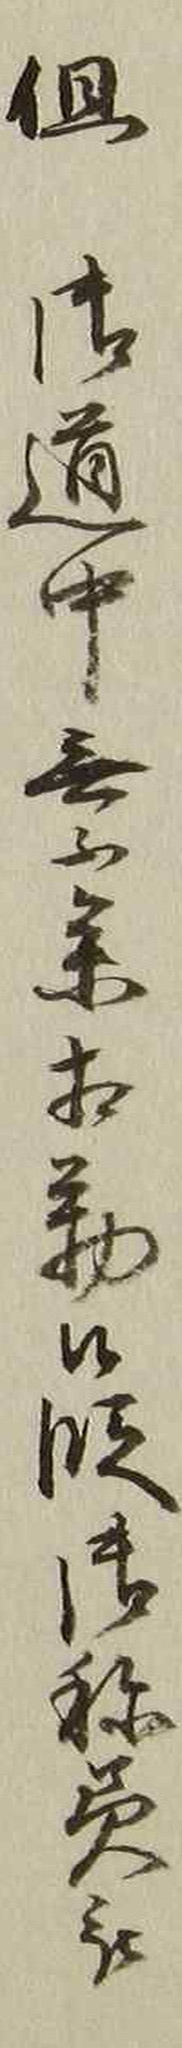但御道中無不参相勤候段御称美被
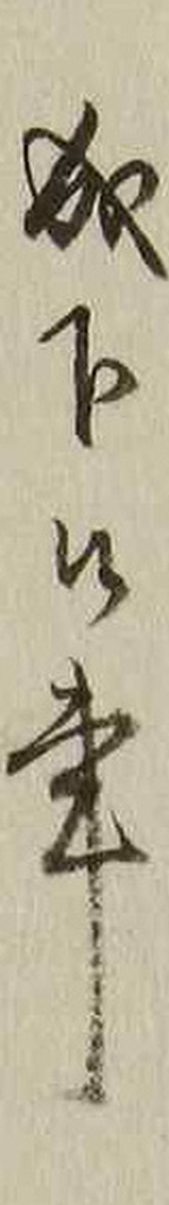成下候事
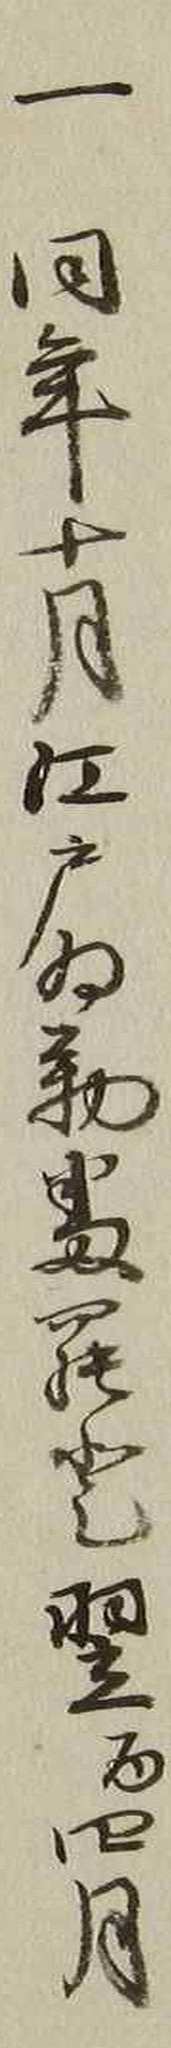一同年十月江戸為勤番罷登翌酉四月
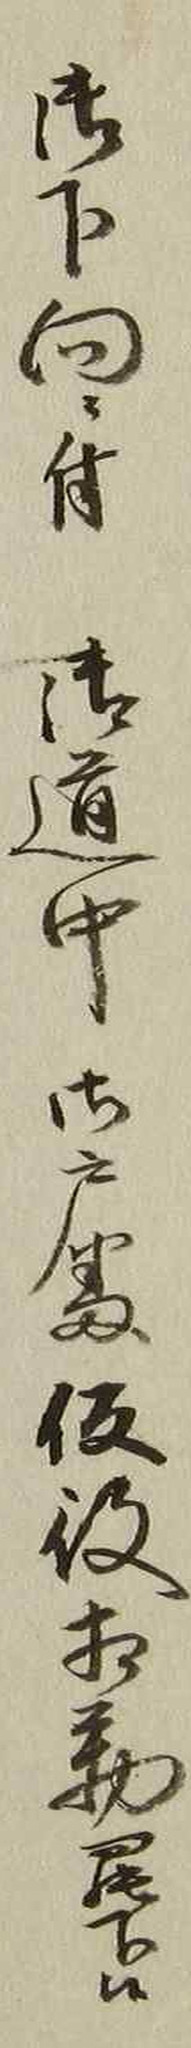御下向ニ付御道中御戸番仮役相勤罷下候
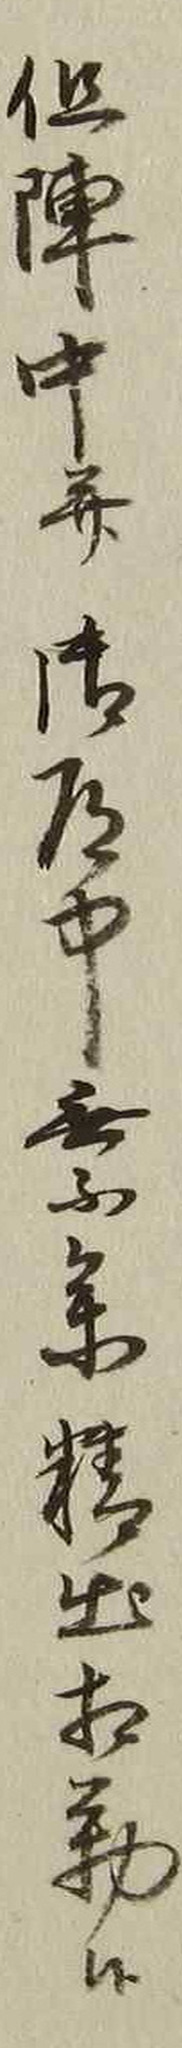但陣中幷御道中無不参精出相勤候
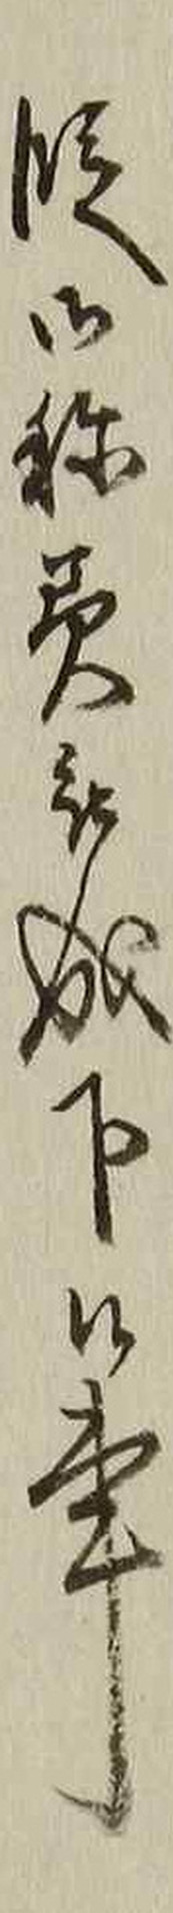段御称美被成下候事
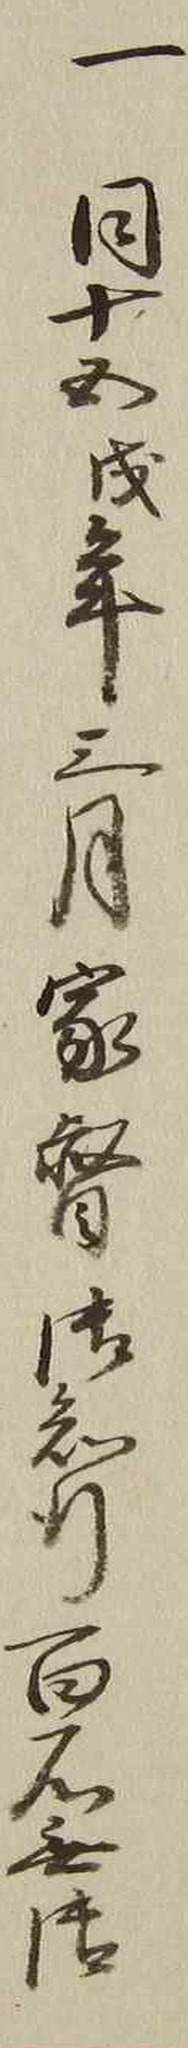一同十五戌年三月家督御知行百石無御
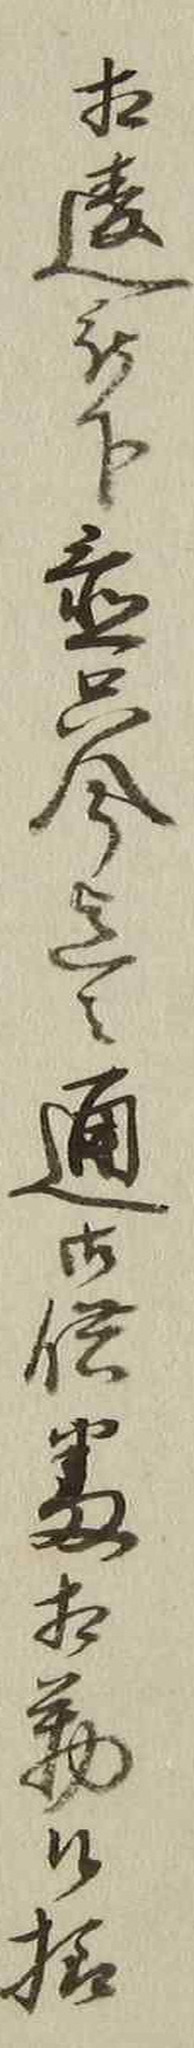相違被下置只今迄之通御供番相勤候様
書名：諸士系譜　巻之128　た之部4
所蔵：会津若松市立会津図書館
